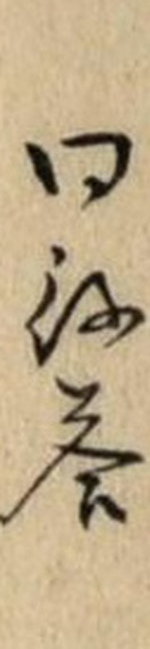同役答
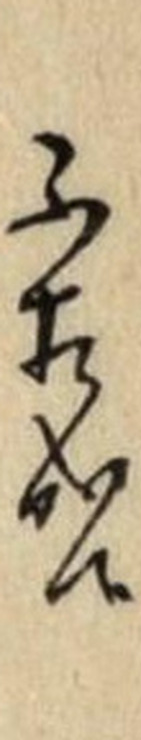不相成候
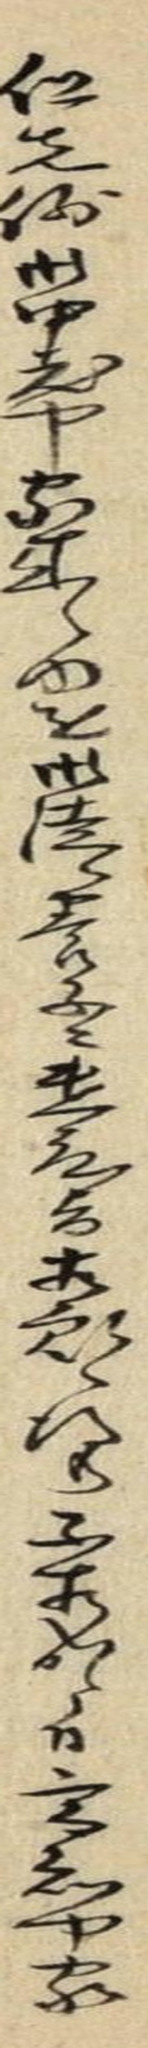但先例御中老中家来之内を御徒へ養子に遣度旨相願候得共不相成候に付高知中家
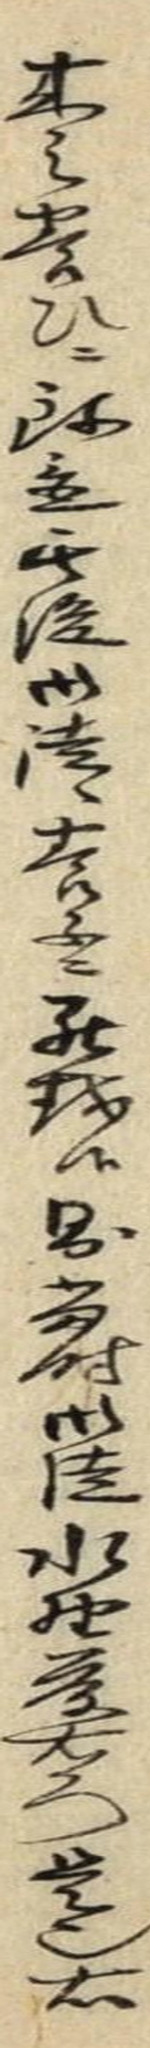来之養ひに致置其後御徒へ養子に罷越候則当時御徒水野藤右衛門是也右
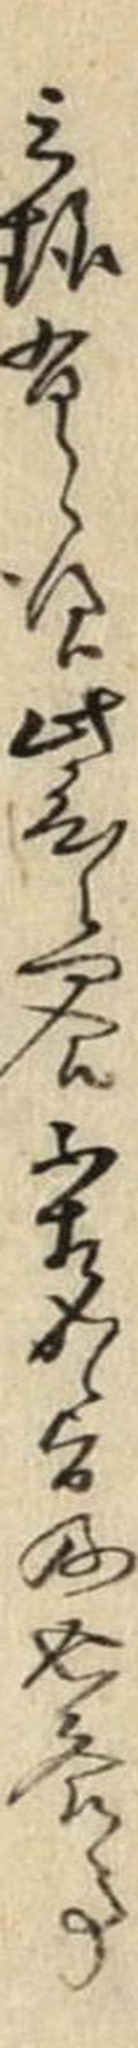之趣有之候得は此度之問合不相成候旨及返答候事
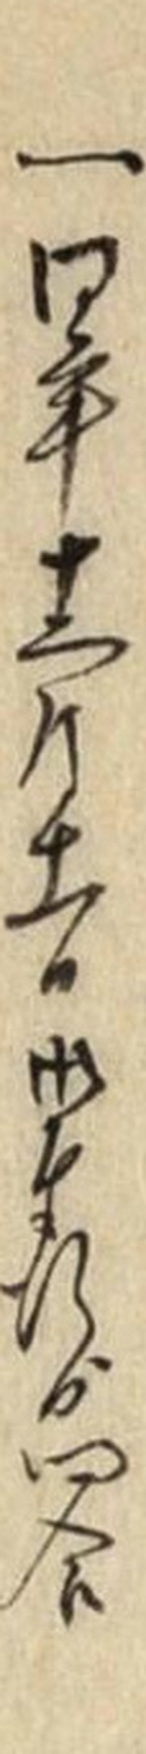一同年十二月十一日御奉行ゟ問合
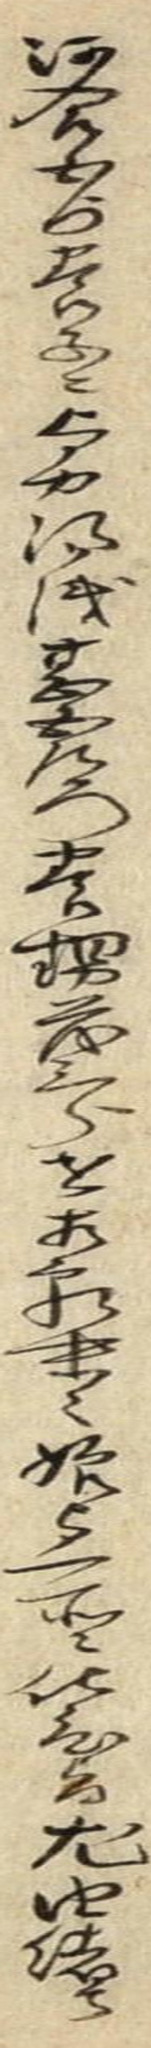河合五右衛門養子に与力湯浅甚五左衛門養甥茂三郎を相願末々娘と一所に仕度旨尤由緒は
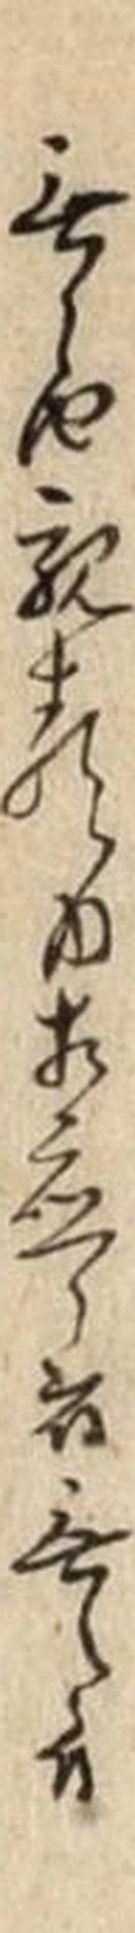無之由親類之内相応之者無之に付
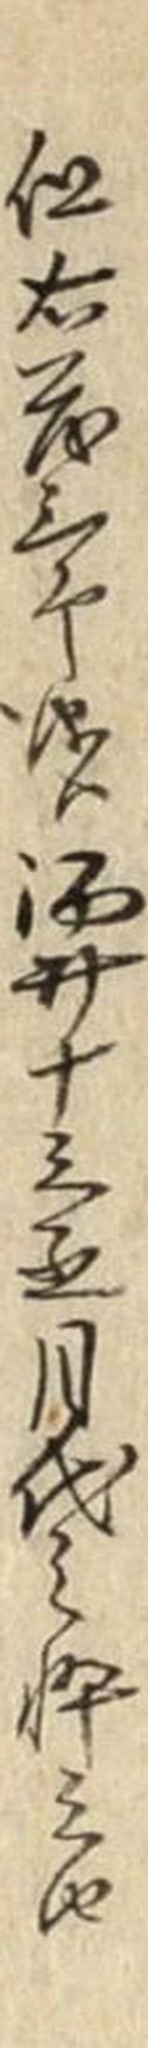但右茂三郎儀は酒井十之丞目代之悴之由
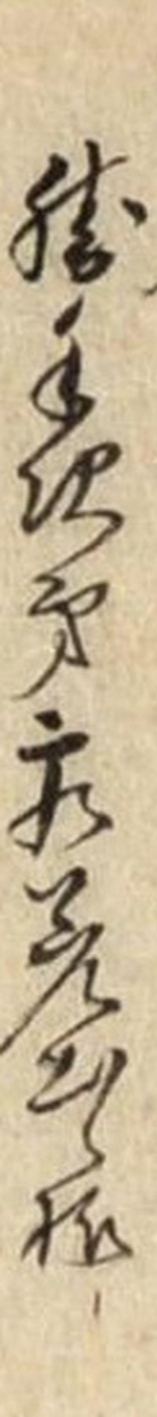勝手次第願差出候様
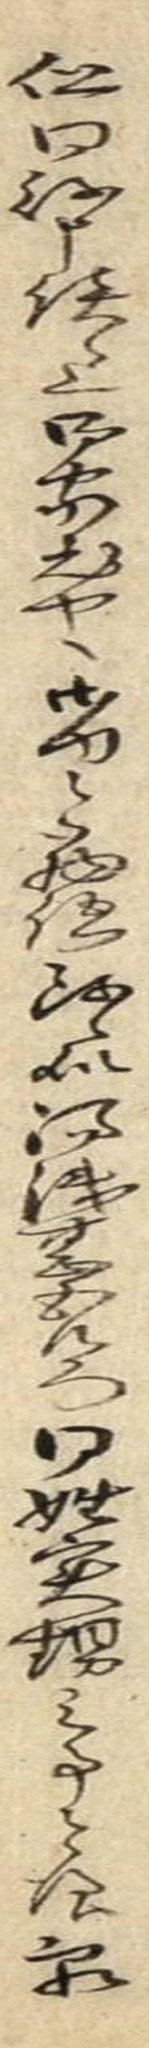但同役申談之上御家老中へ御内々御物語致候処湯浅甚五左衛門同姓実甥之事候得は願
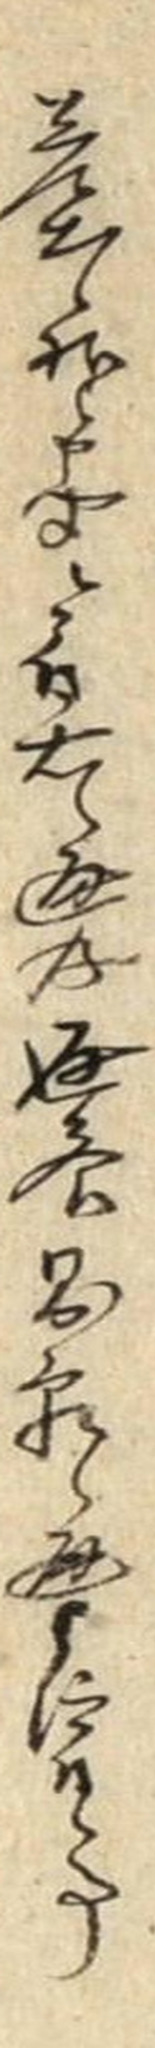差出候様申聞候に付右之通及返答則願之通被仰付候事

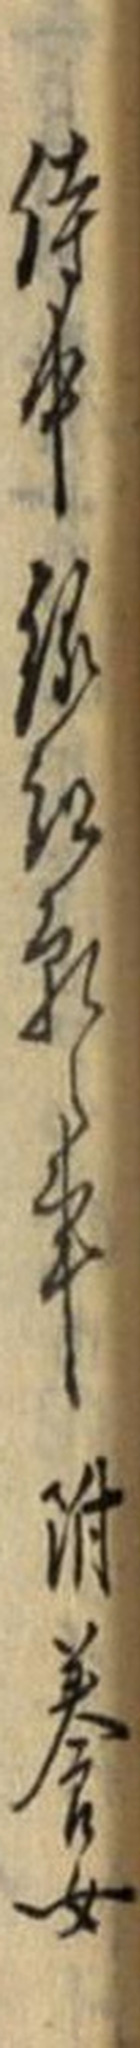侍中縁組願之事附養女
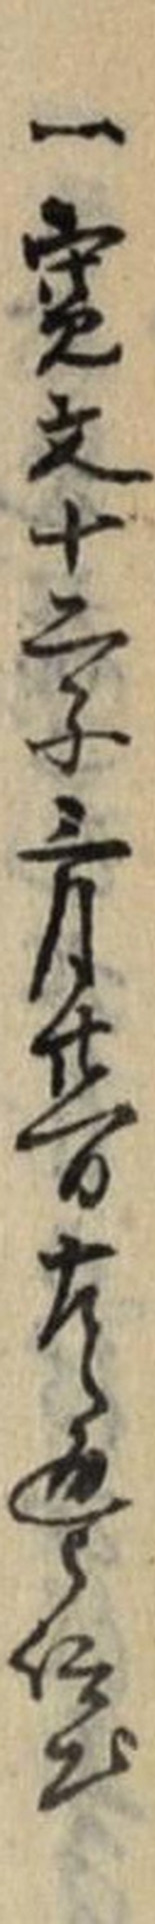一寛文十二子三月廿一日左之通被仰出
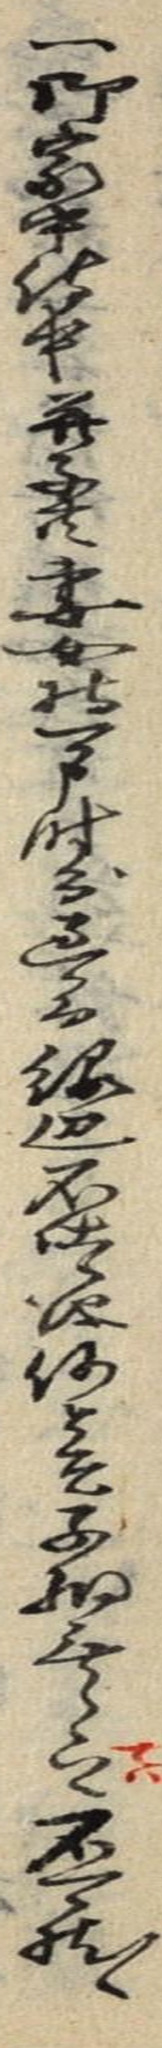一御家中侍中并子共妻女持可申時分過候而縁辺不仕候儀何とそ子細無之候ハヽ不可然候
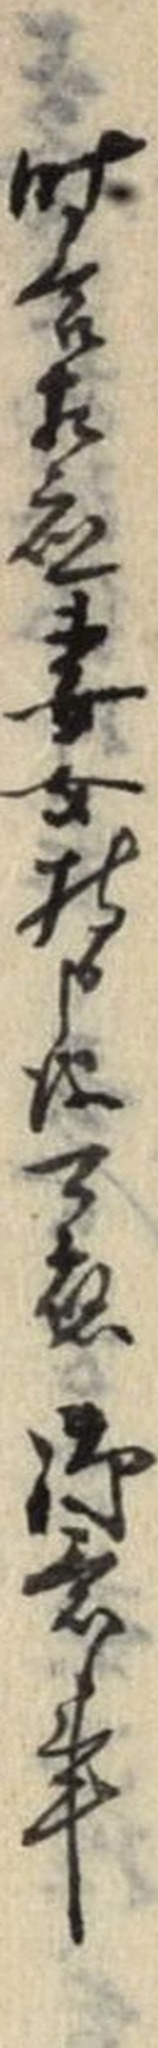時節相応妻女持申儀可応御意候事
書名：養子縁組之部
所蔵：福井県文書館 Fukui Prefectural Archives
